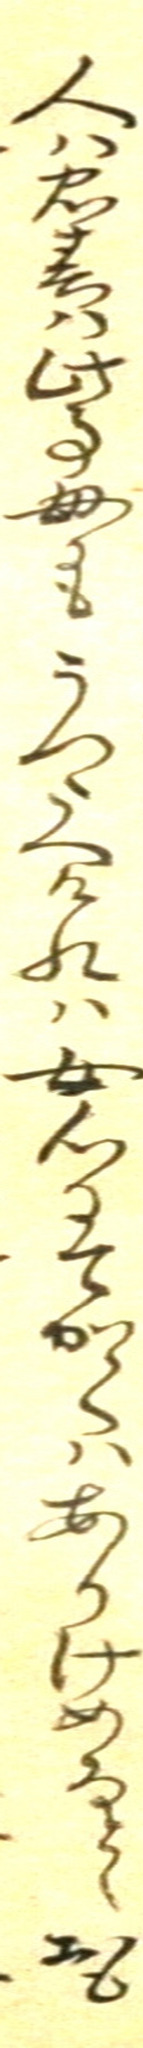人は忠春は此事母にもうつたへけれは女心にてかくはありけめなとゝおも
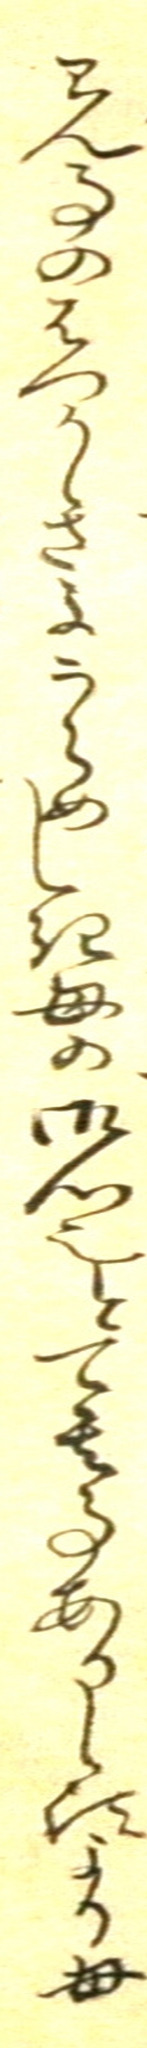わん事のはつかしさようらめしき母の御心也とて其事ありし頃より母

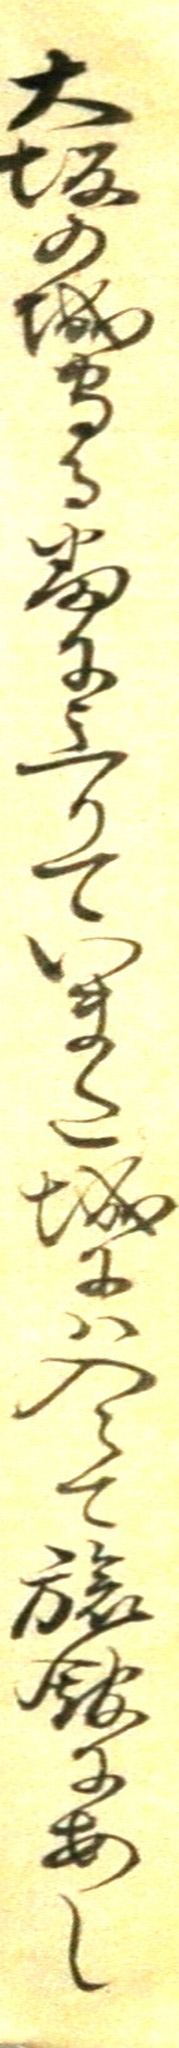大坂の城守る番に上りていまた城には入らて旅舘にあし
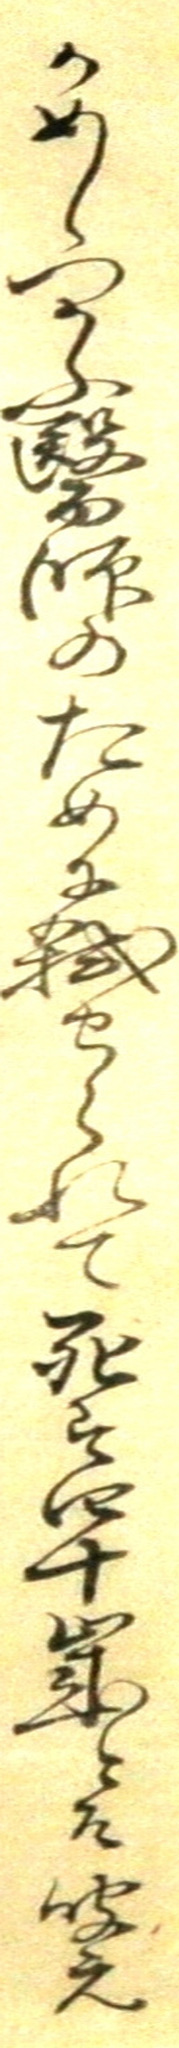かめしつかふ医師のために弑せられて死す四十歳とそ聞え
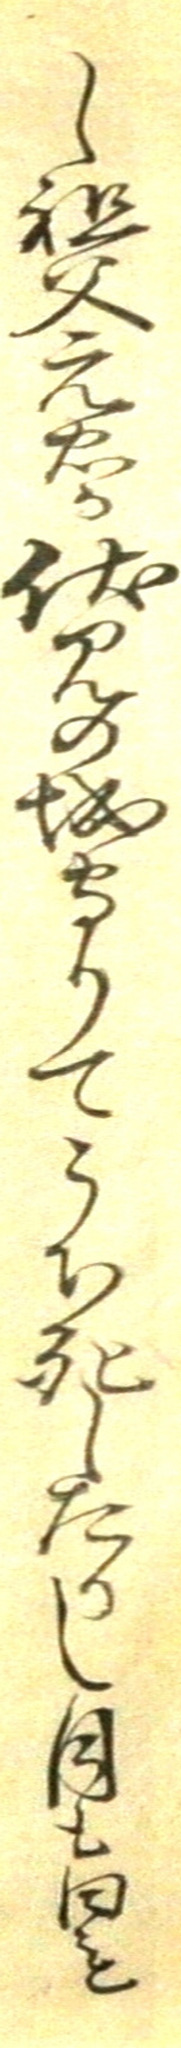し祖父元忠か伏見の城守りてうち死したりし月も日も
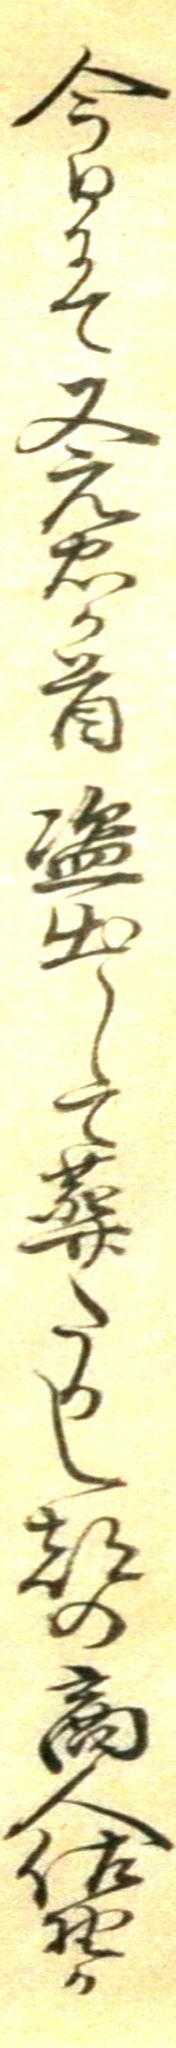今日にて又元忠か首盗出して葬たりし都の商人佐野か
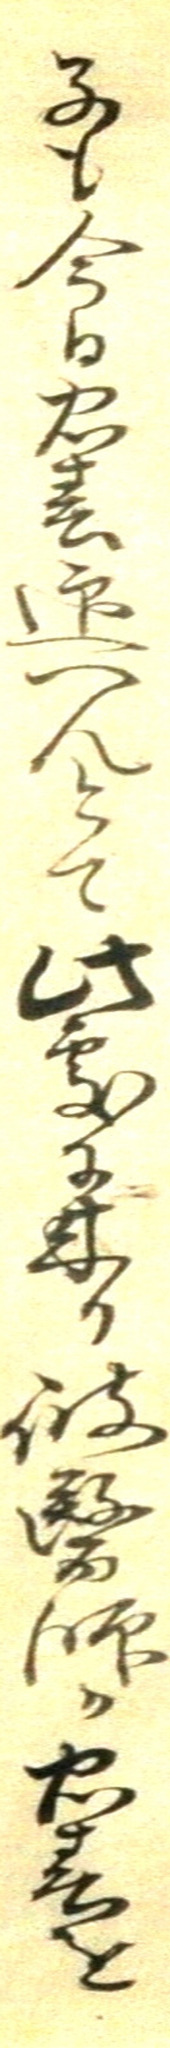子も今日忠春迎へんとて此処に来り彼医師か忠春を
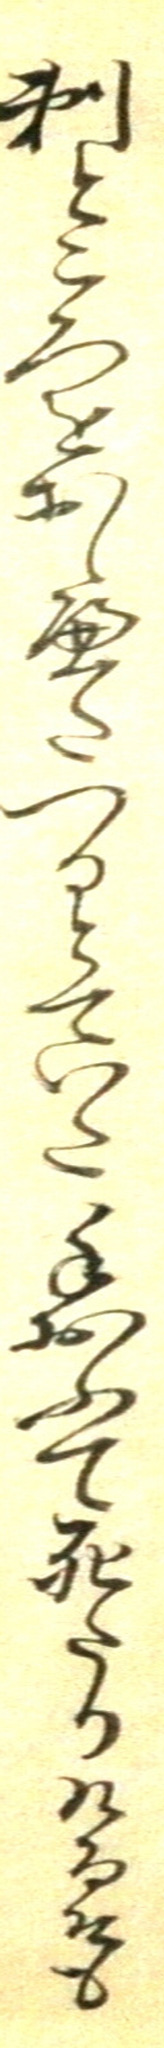刺ところをおしへたつるとていた手おふて死たりけるそも
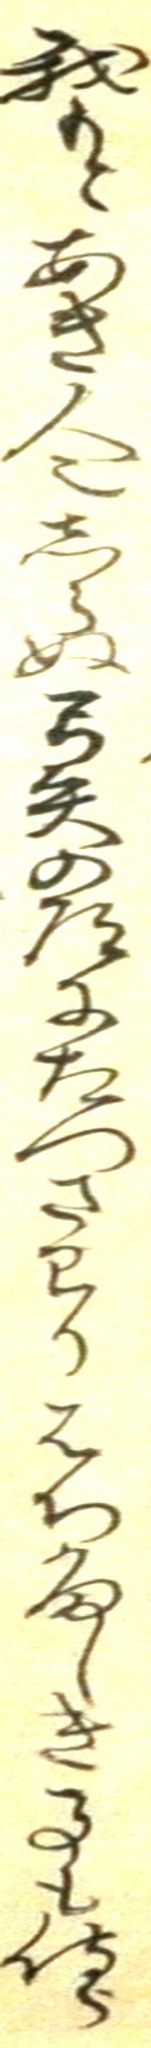我もとあき人也しらぬ弓矢の道にたつさわりはちかましき事も侍ら
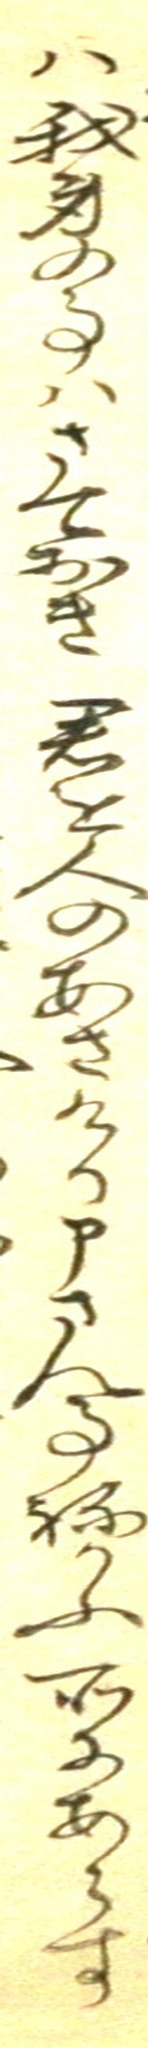は我身の事はさておき君を人のあさけり申さん事ねかふ所にあらす
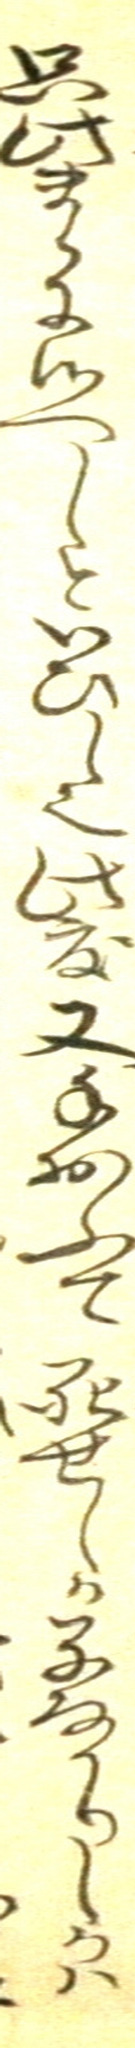只此まゝに候へしといひし也此度又手おふて死せしか子なかりしかは
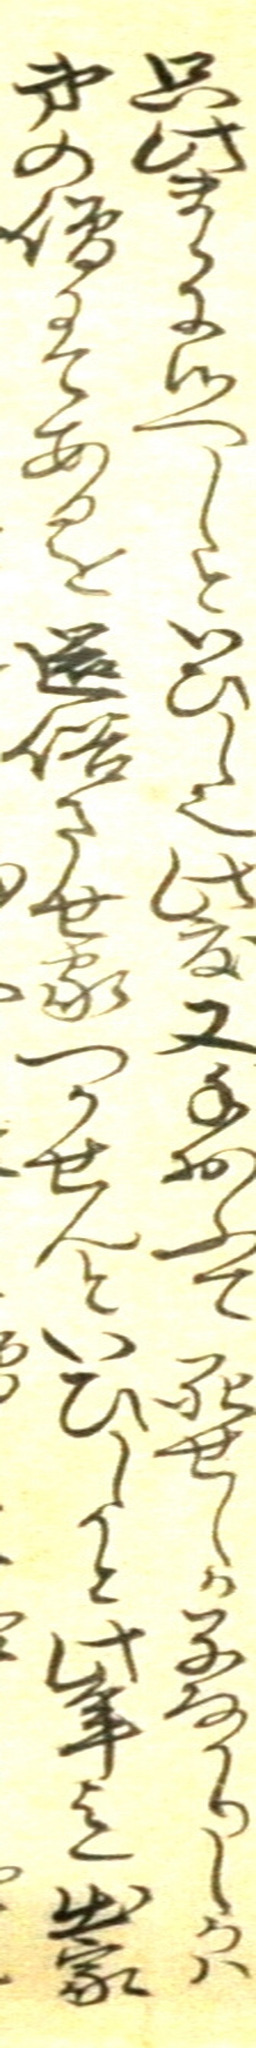弟の僧にてあるを還俗させ家つかせんといひしかと此年迄出家
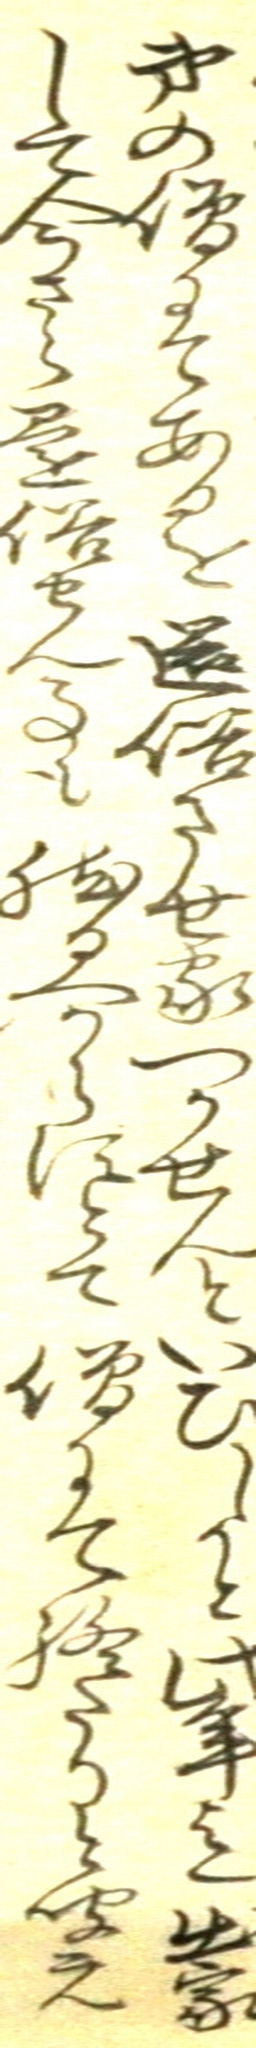して今さら還俗せん事も然るへからすとて僧にて終たりと聞え
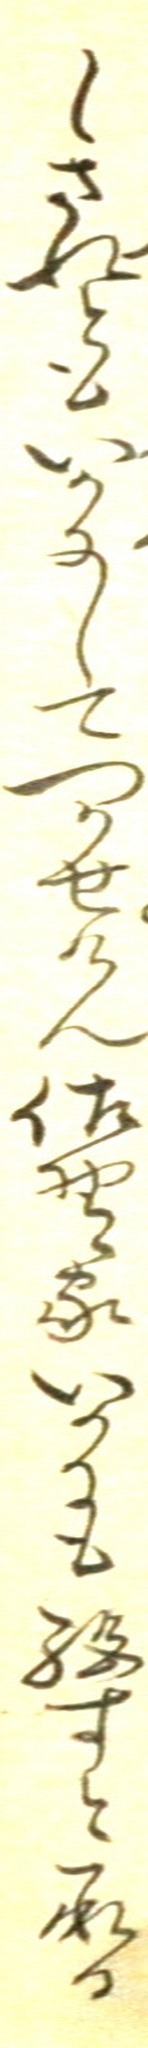しされともいかにしてつかせけん佐野ゝ家いかにも絶すと承る
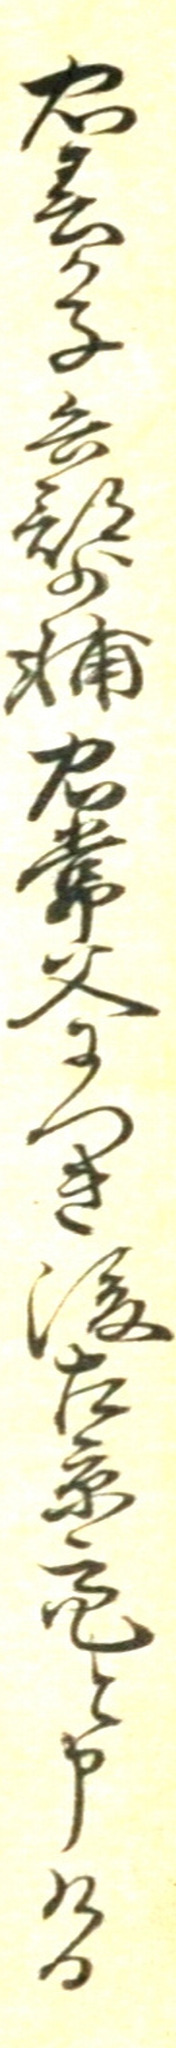忠春か子兵部少輔忠常父につき後左京亮と申ける
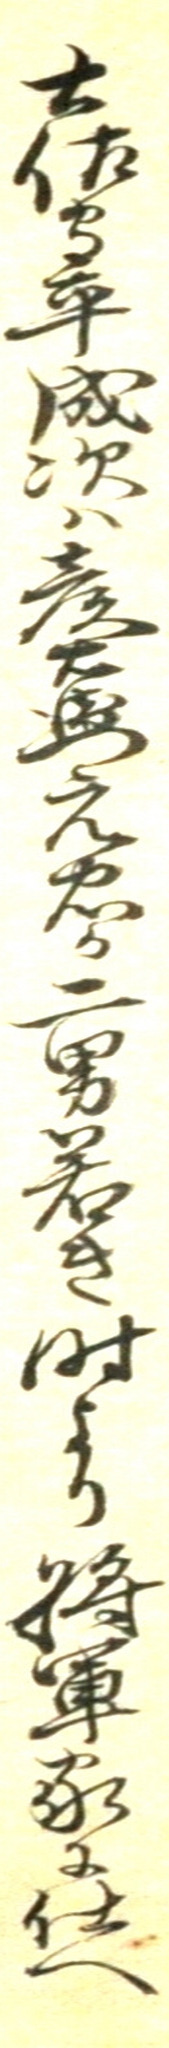土佐守平成次は彦右衛門元忠か二男若き時より将軍家に仕へ
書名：藩翰譜（四・中）
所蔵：伊那市立高遠町図書館・合同会社AMANE
